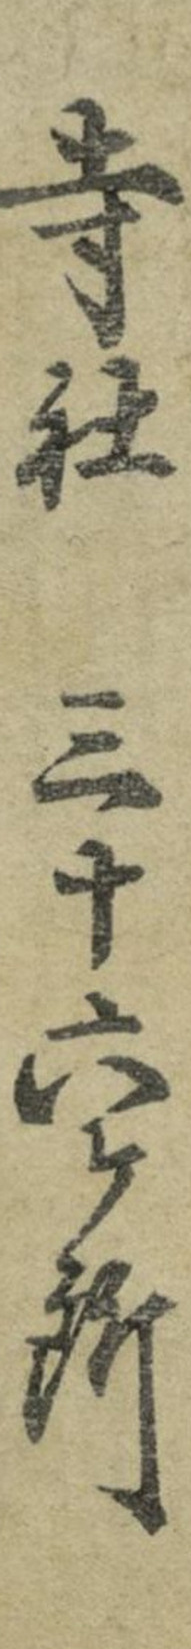寺社三十六ヶ所
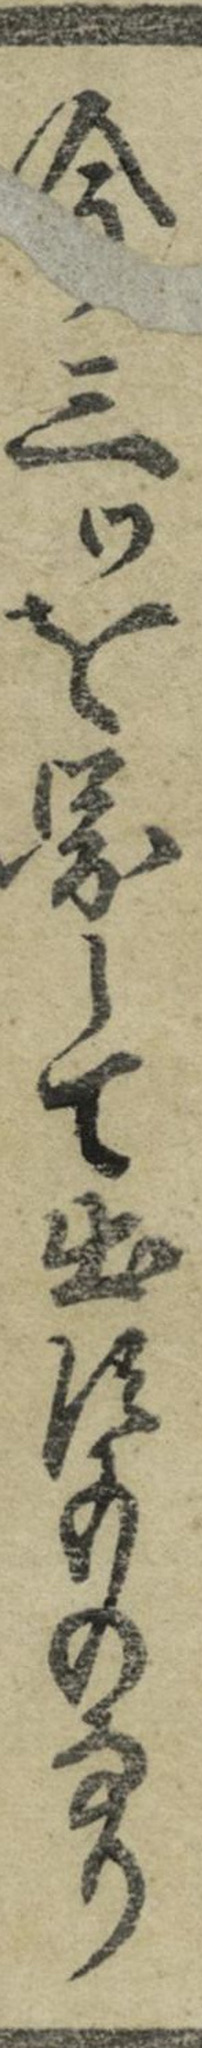今三ツを図して出すものなり
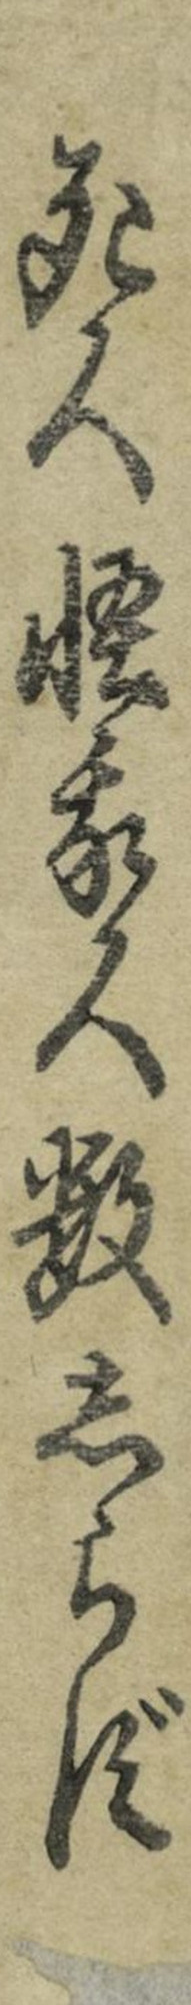死人怪我人数しらず
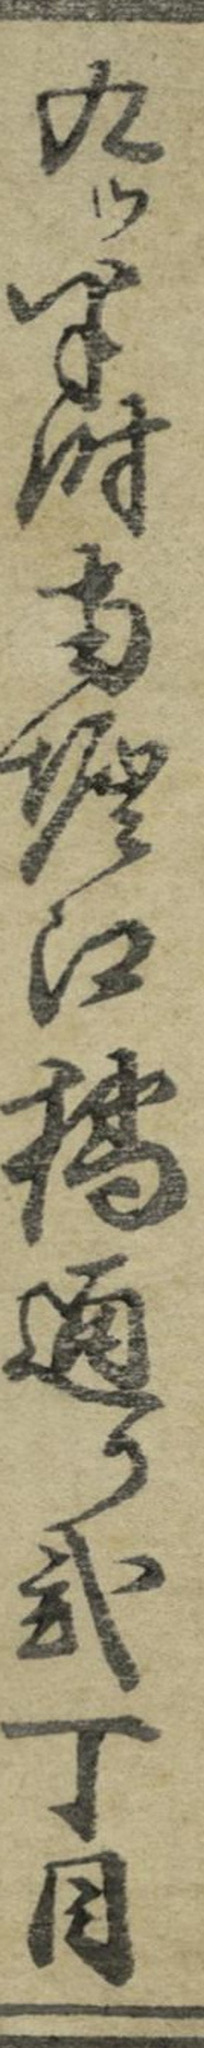九ッ半時南堀江橋通り弐丁目
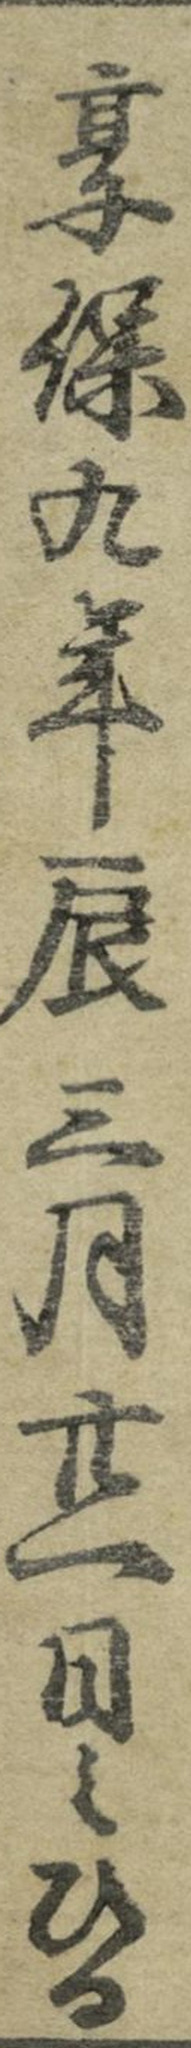享保九年辰三月廿一日のひる
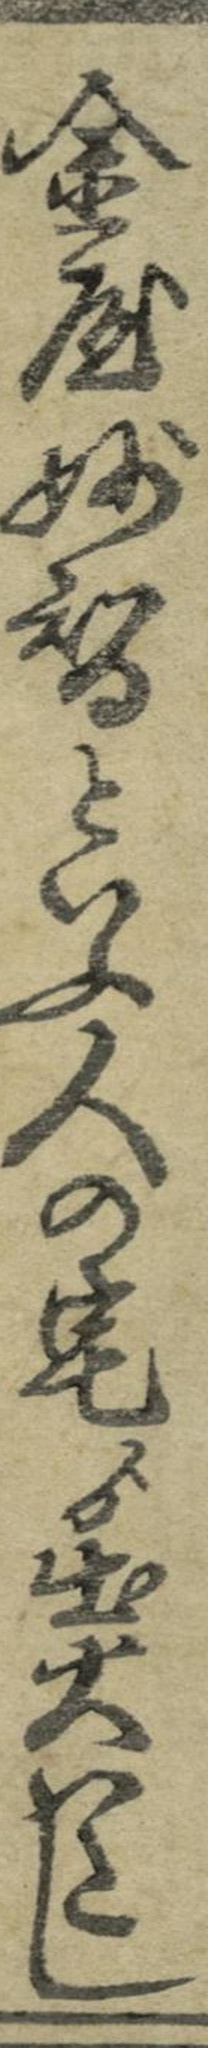金屋妙智といふ人の宅ゟ出火いたし
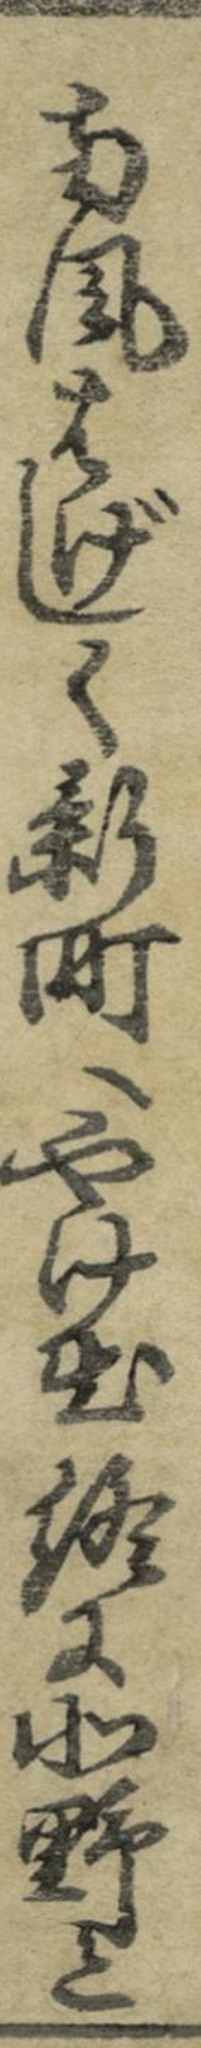南風はげしく新町へやけ出終に北野迄
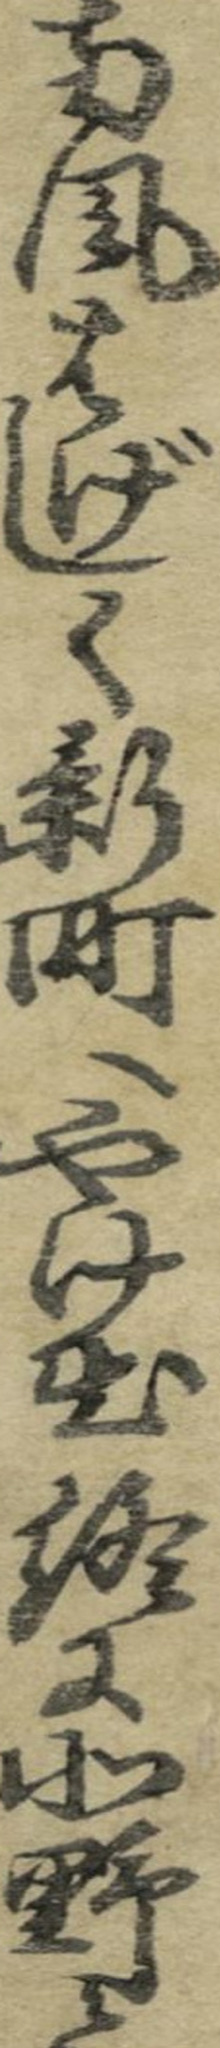南風はげしく新町へやけ出終に北野迄
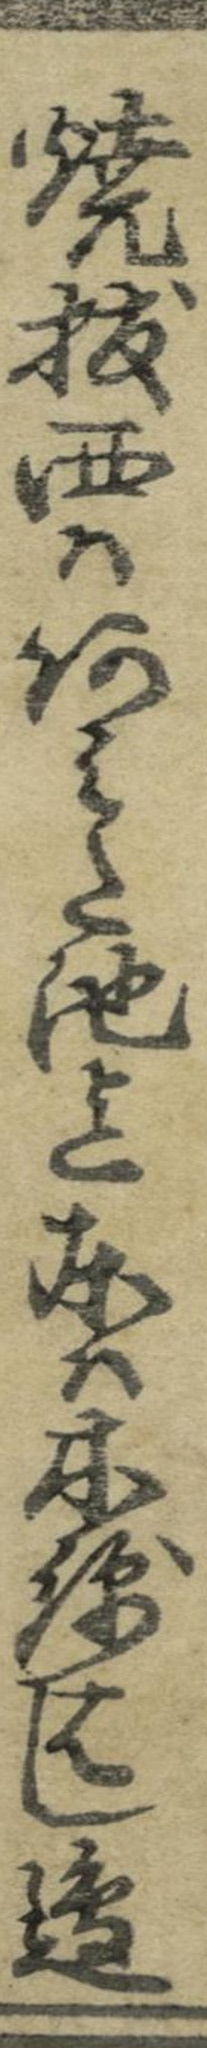焼抜西はあみた池迄東は木綿はし辺
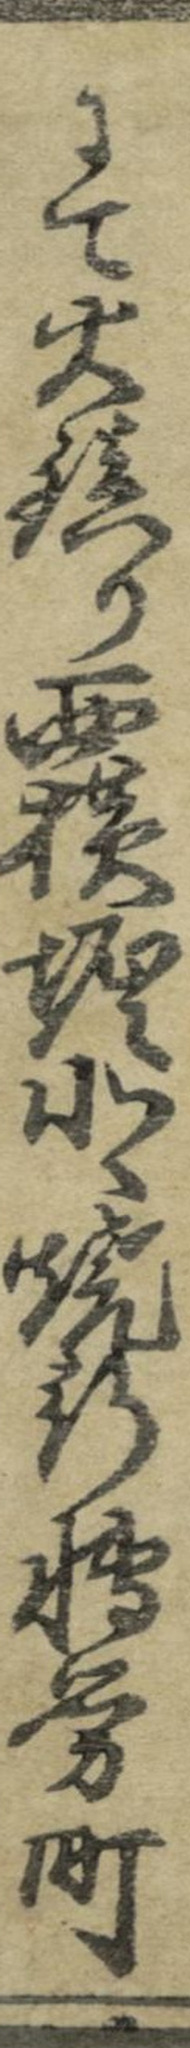にて火鎮り西横堀北へ焼行博労町
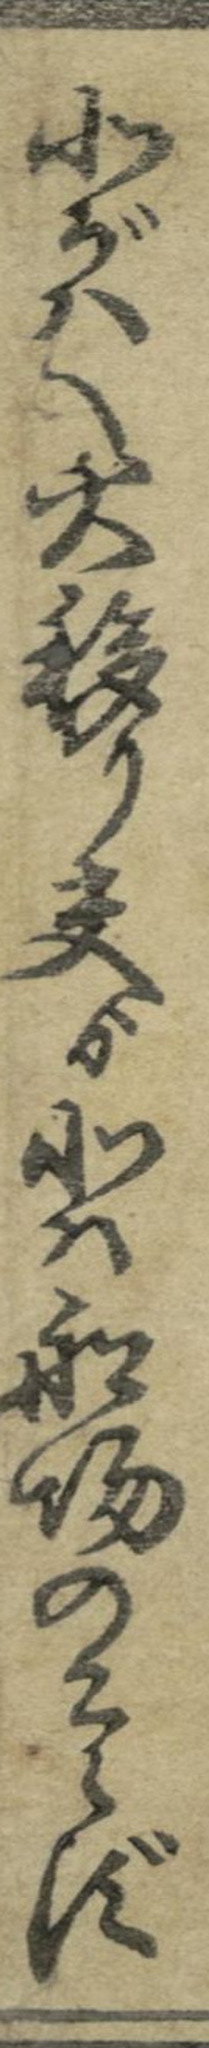北がはへ火移り夫ゟ北は船場のこらず
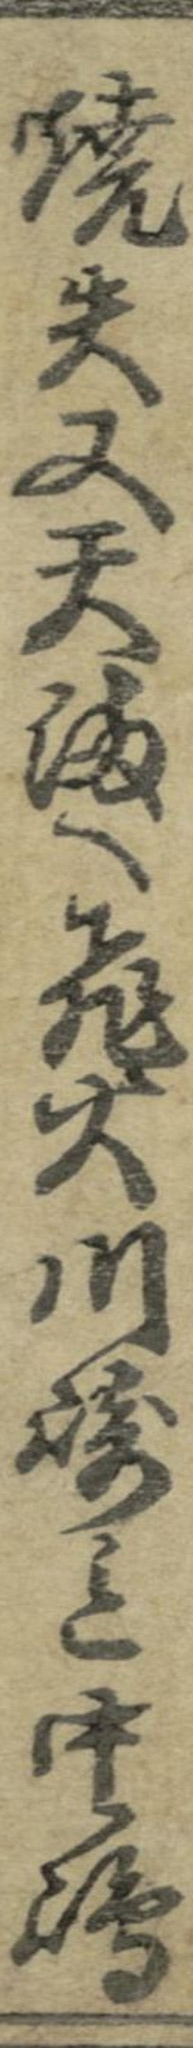焼失又天満へ飛火川崎迄中之嶋
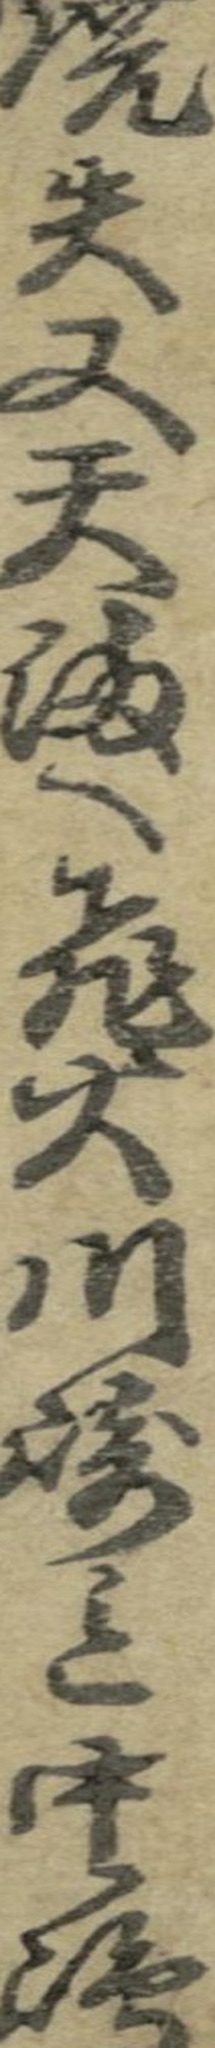焼失又天満へ飛火川崎迄中之嶋
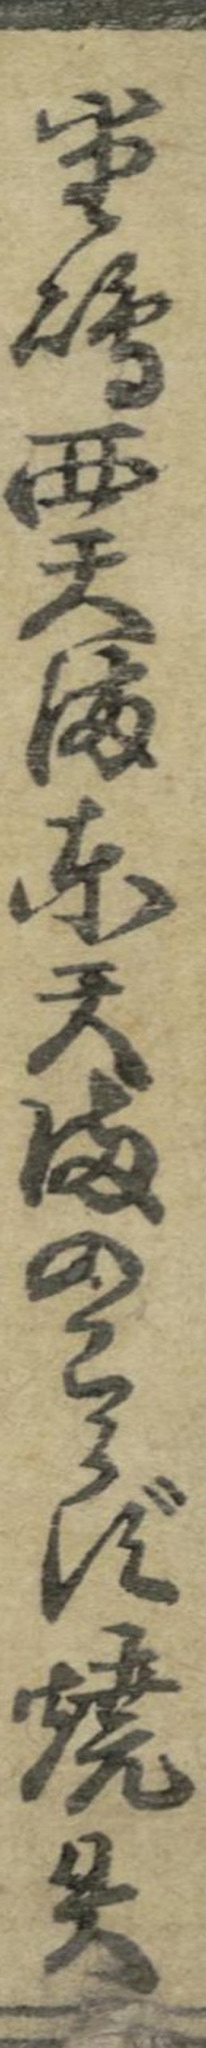堂嶋西天満東天満のこらず焼失
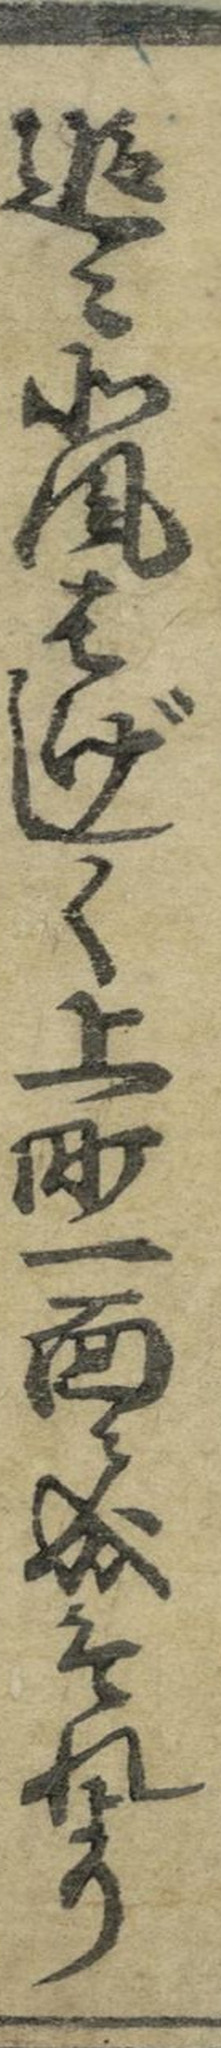追々北風はげしく上町一面ニ成それより
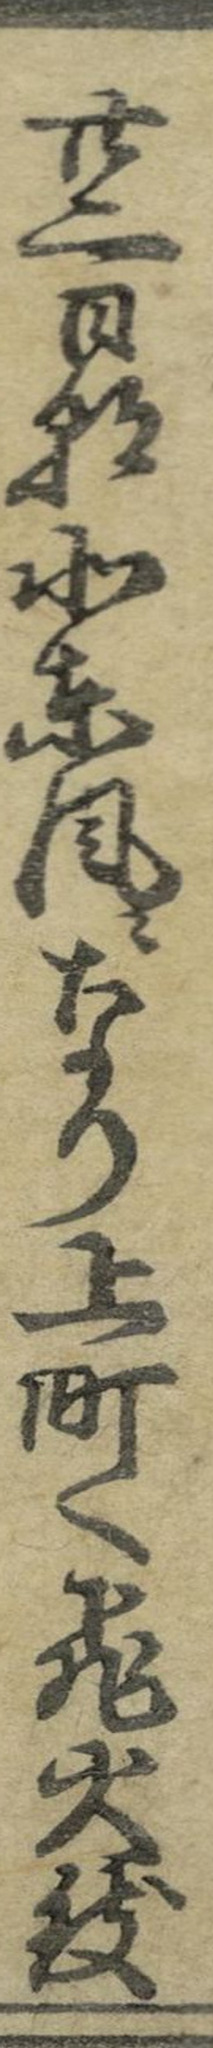廿二日朝北東風ニなり上町へ飛火致
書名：大阪今昔三度の大火
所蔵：東京大学地震研究所図書室 Earthquake Research Institute Library, The University of Tokyo, JAPAN
